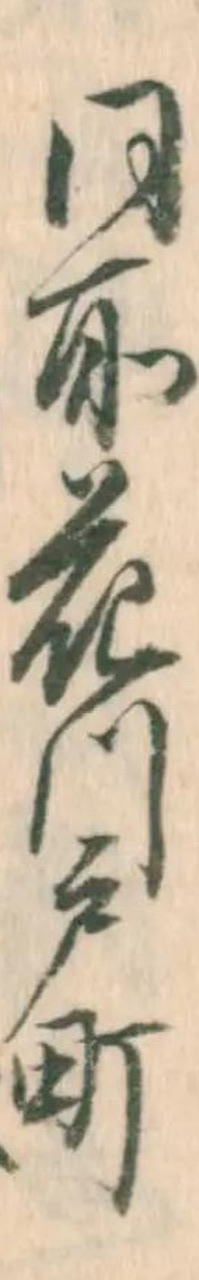同所花川戸町
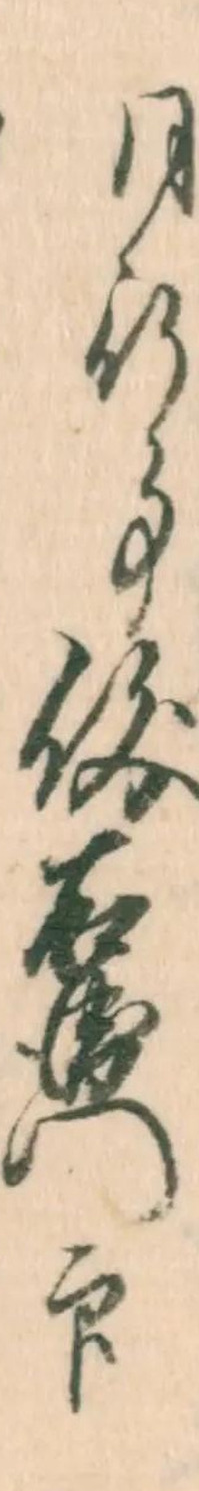月行事儀右衛門印
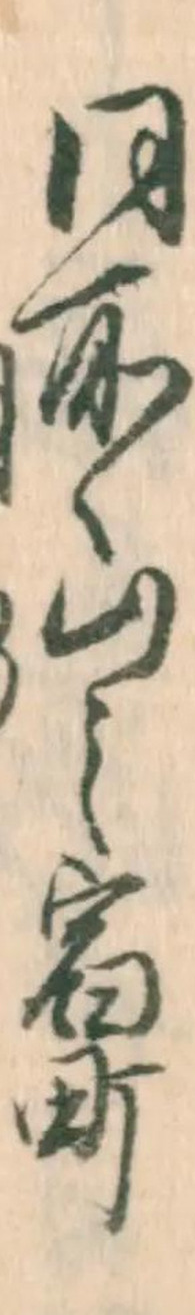同所山之宿町
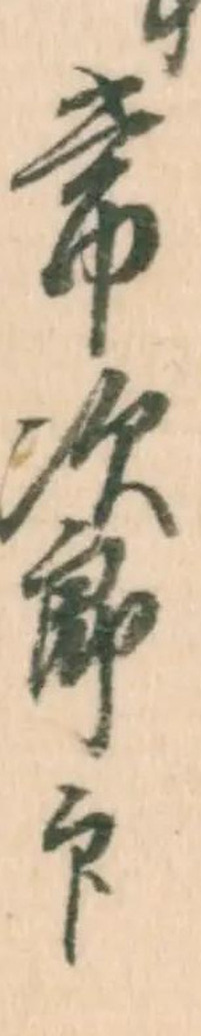月行事常次郎印
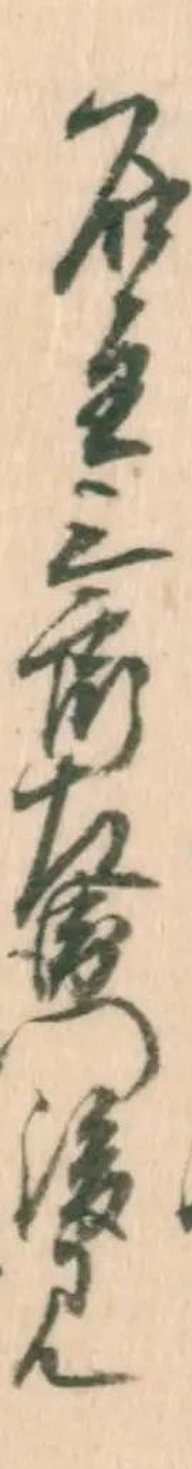名主三郎左衛門後見
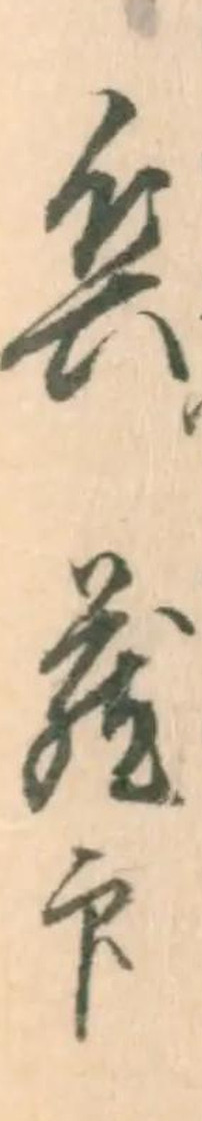兵蔵印
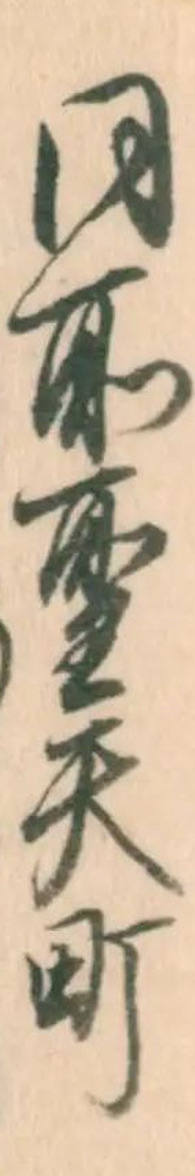同所聖天町
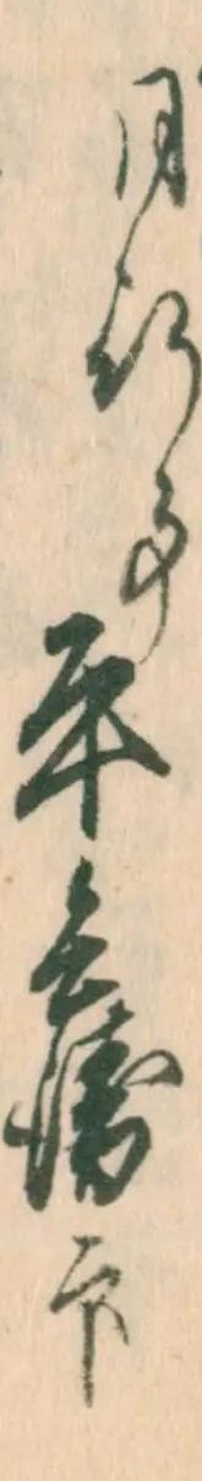月行事平兵衛印
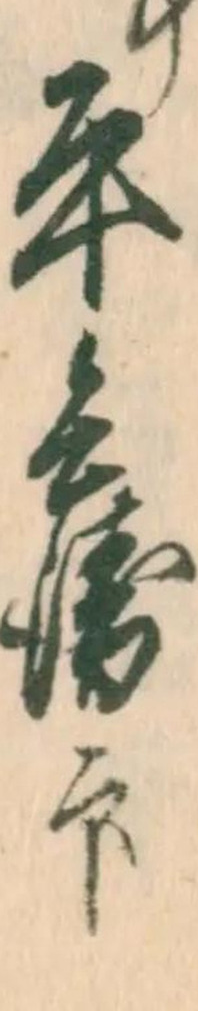月行事平兵衛印
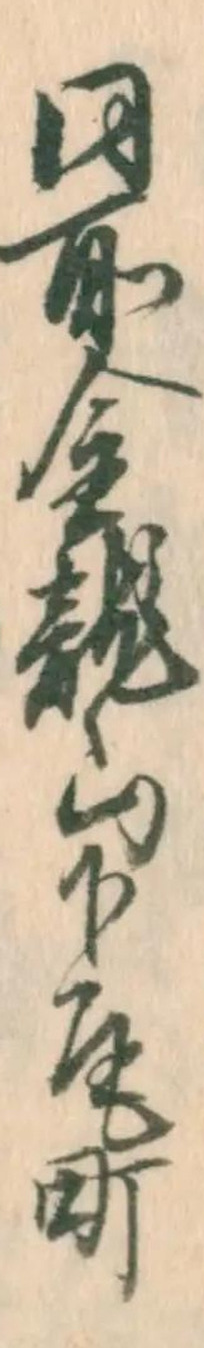同所金龍山下瓦町
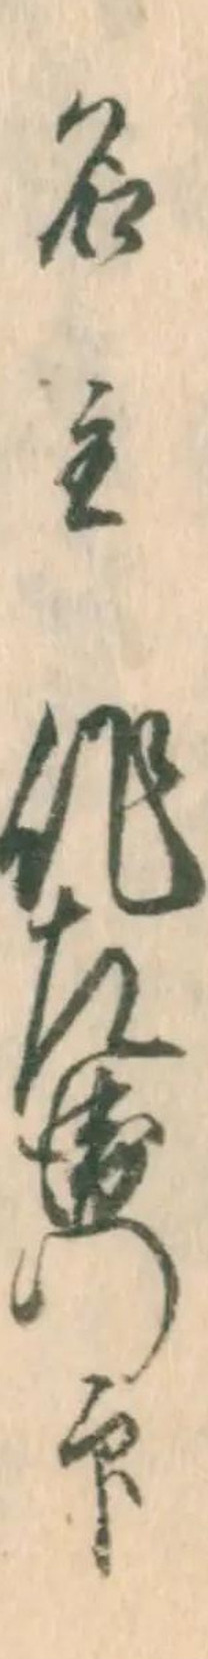名主作左衛門印
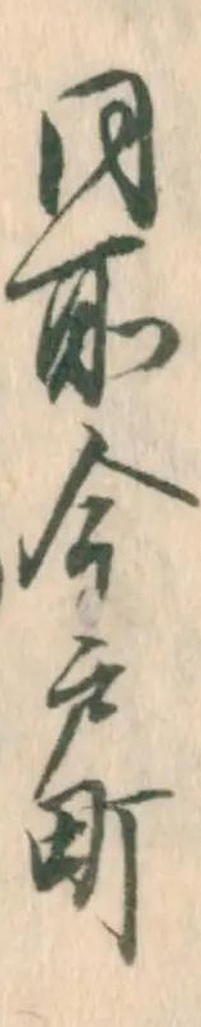同所今戸町
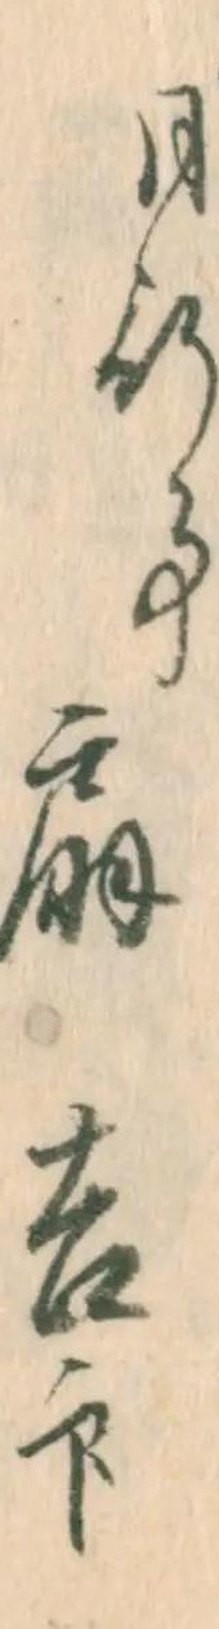月行事扇吉印
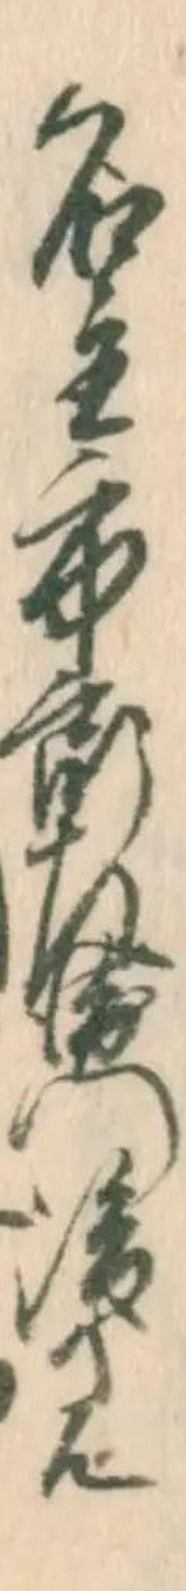名主市郎左衛門後見
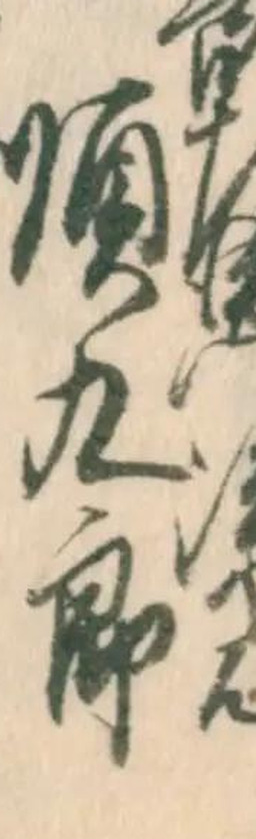順九郎
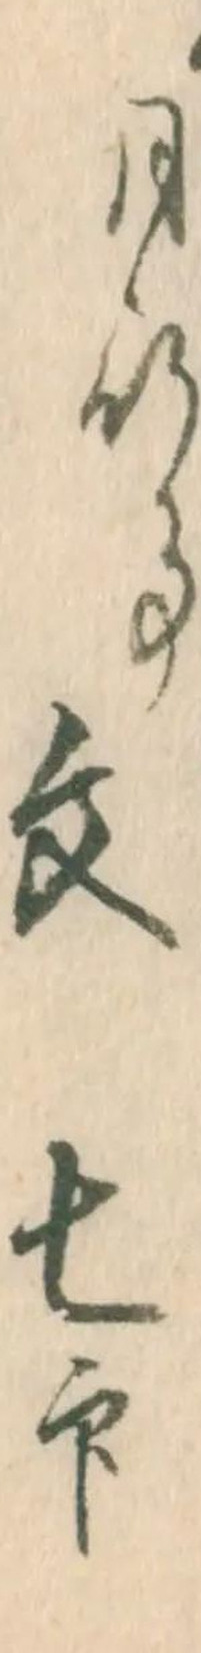月行事文七印
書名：地震災書留 2巻. [2] 内表紙に「地震一件　安政二卯年十月」とあり
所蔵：国立国会図書館 National Diet Library, JAPAN
